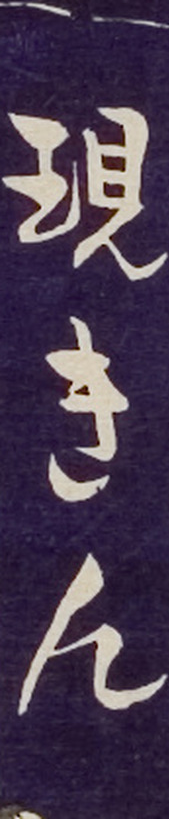現きん
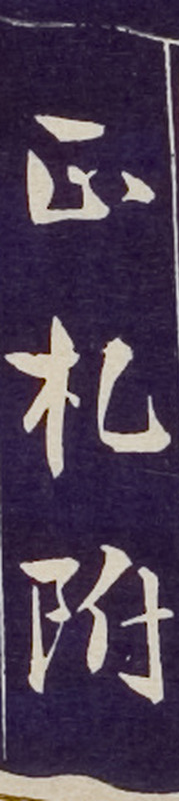正札附
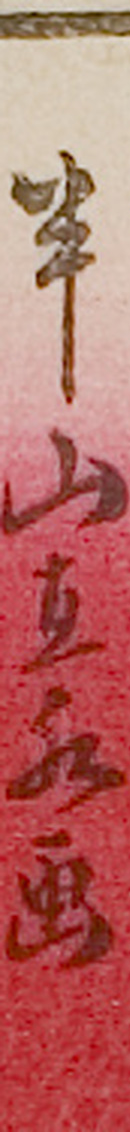半山直水画
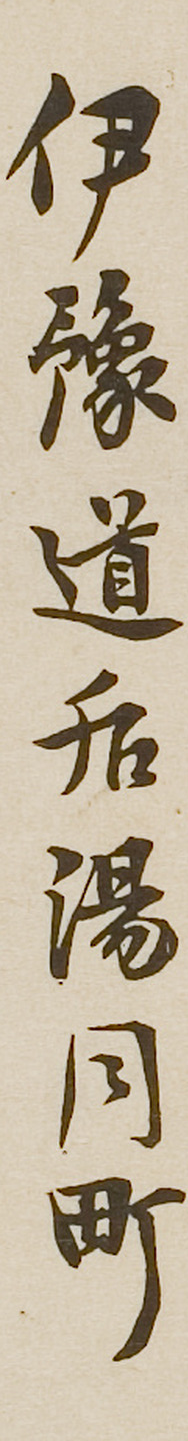伊豫道后湯同町
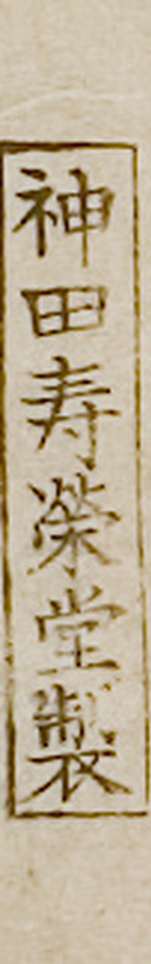神田寿栄堂製
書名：[伊予道後富屋引札]
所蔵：東京大学総合図書館 General Library in the University of Tokyo, JAPAN
